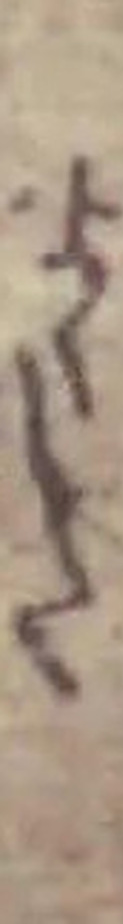よくした
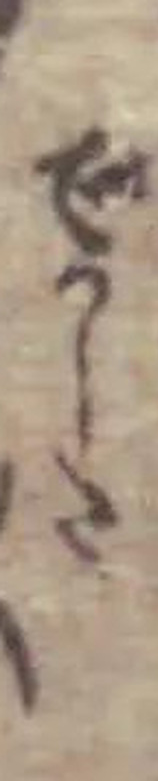でかした

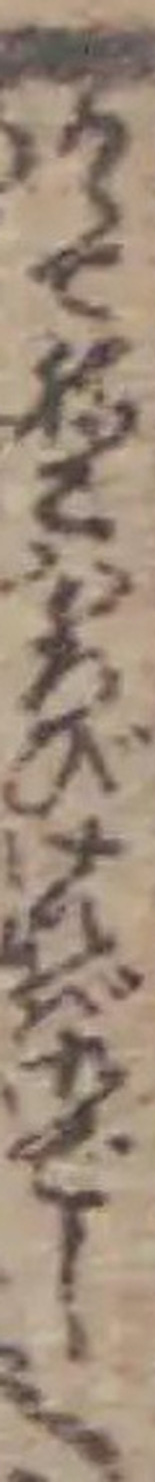かうてねこはほろびければ御でし
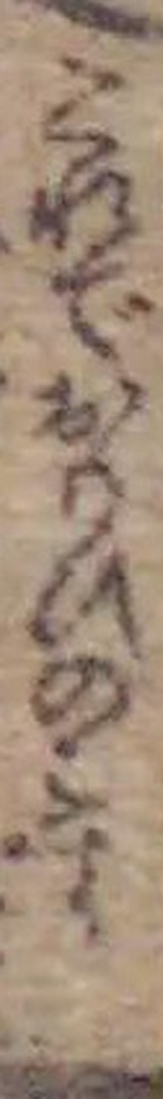これでおもひのこす
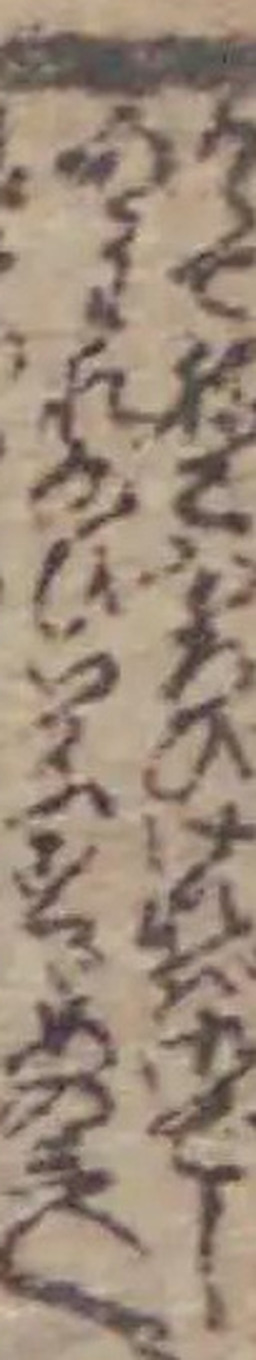あらわれ給ひつかふすゞめの三人
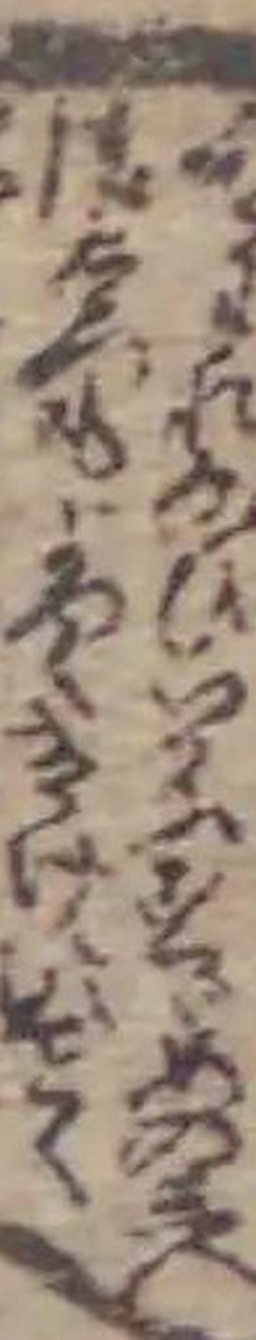清右エ門もよつくきけく
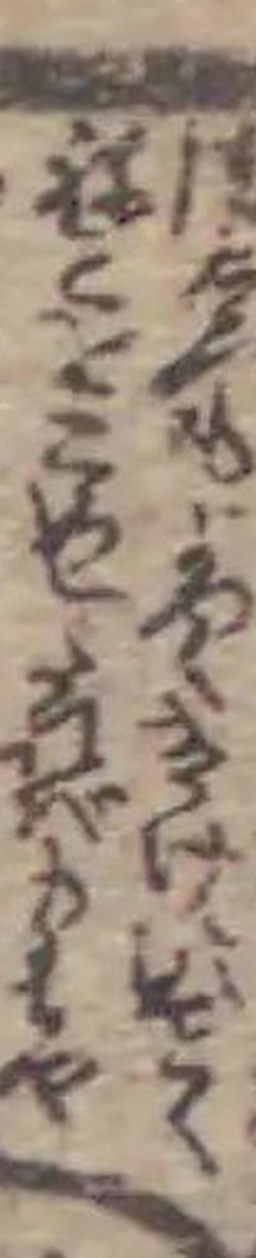ねこをころしたればもはや
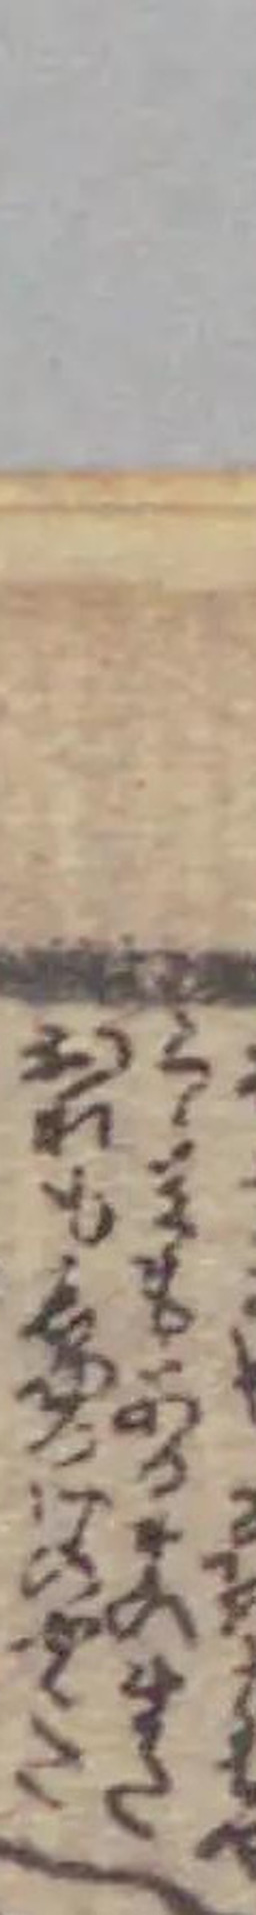おれもしゆつけのやくた
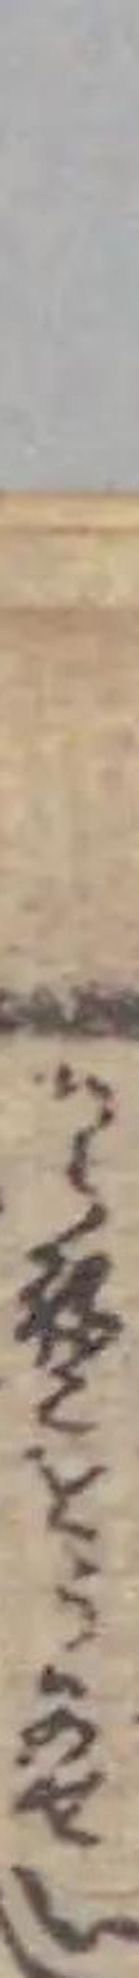からねこをうかめせ
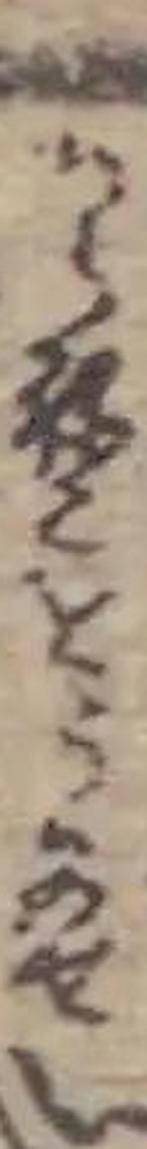からねこをうかめせ
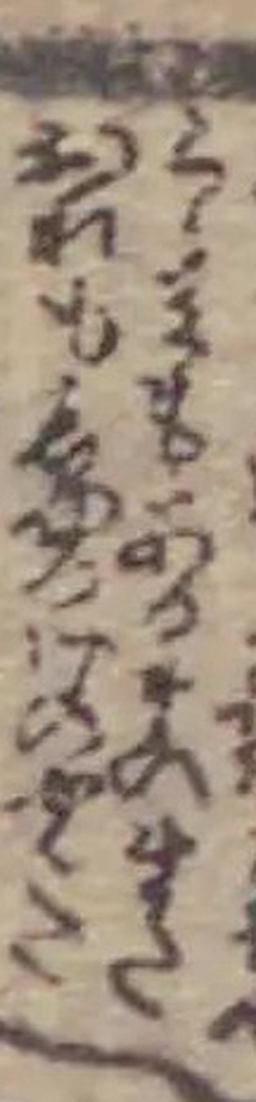おれもしゆつけのやくた
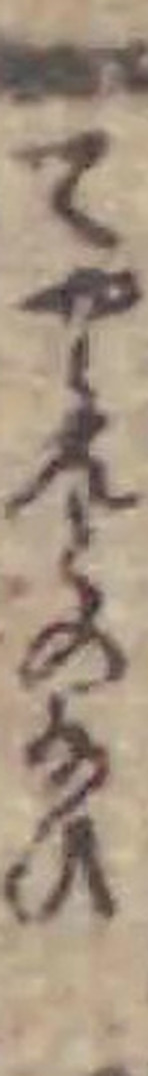てやらんとの給ひ
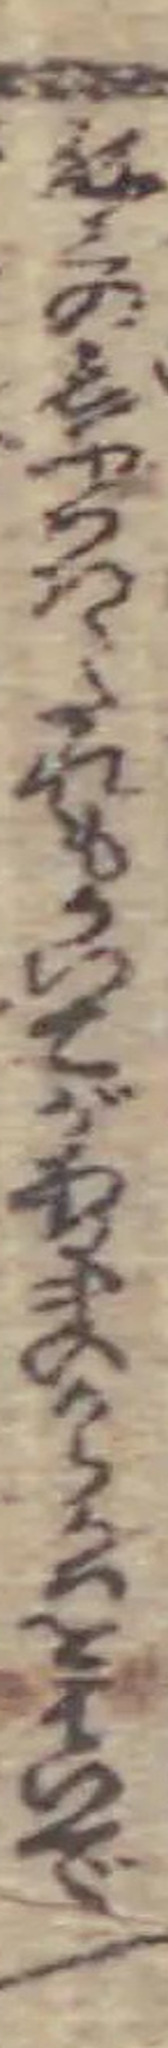ねこのしたれもかいてがあるまいからかはをはいで
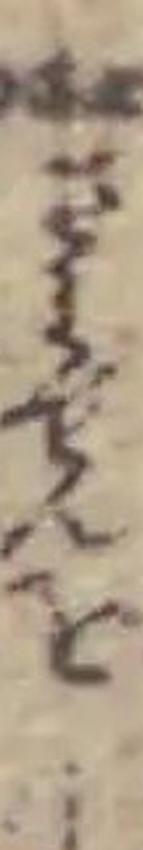さみせんを
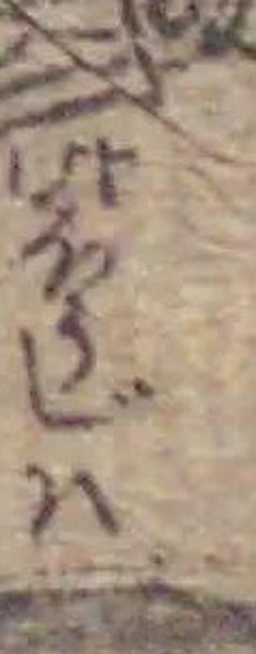此ほうじは
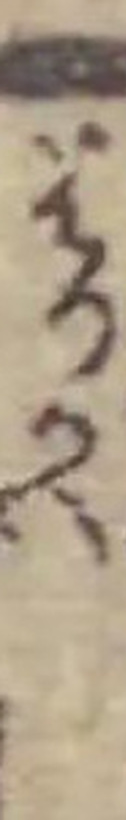はりかへ
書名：冷水灰毛猫 2巻
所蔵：国立国会図書館 National Diet Library, JAPAN
